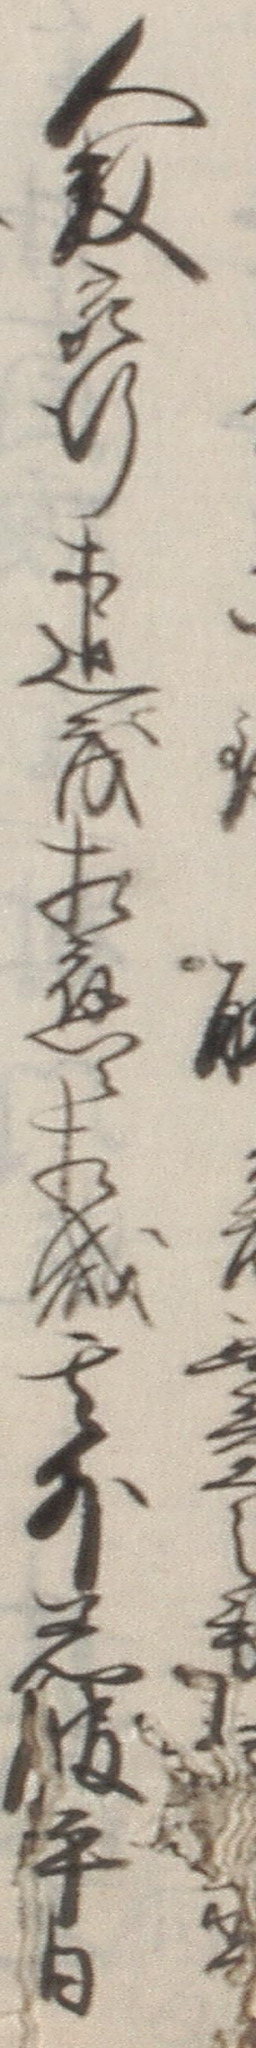人数宛行等迄も相応ニ相減其外着服平日
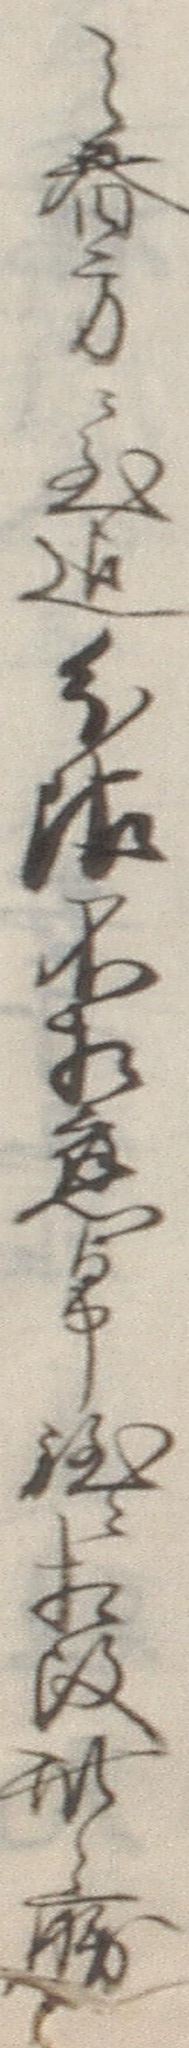之暮方ニ至迄分限不相応と申程ニ相改此上勝
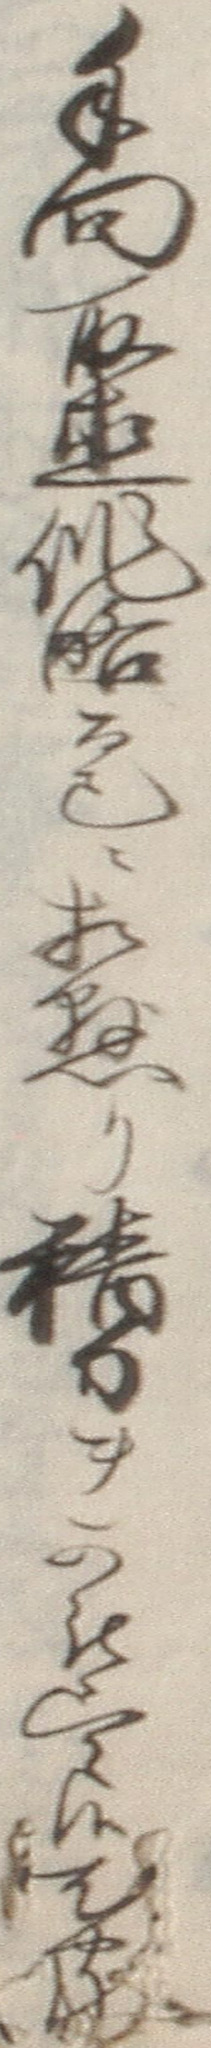手向取直作略而已ニ相懸り精力ヲ可被尽候尤家
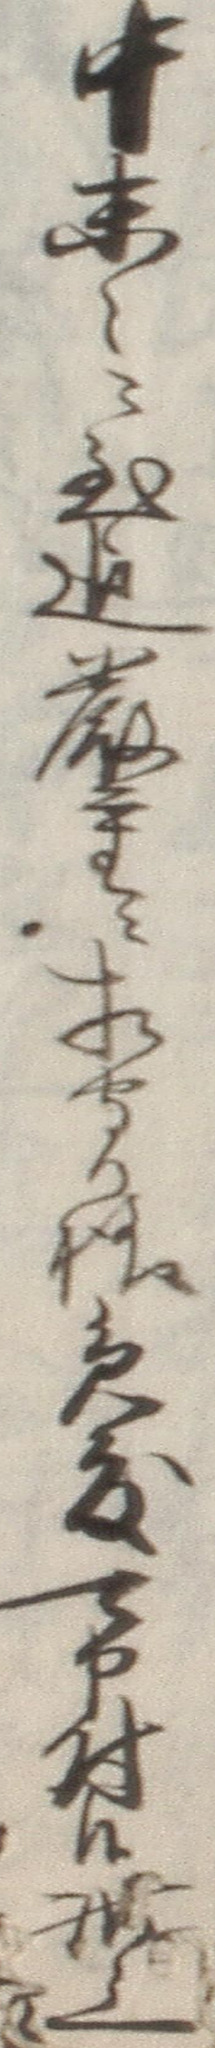申末々ニ至迄厳重ニ相守候様急度可申付候此上
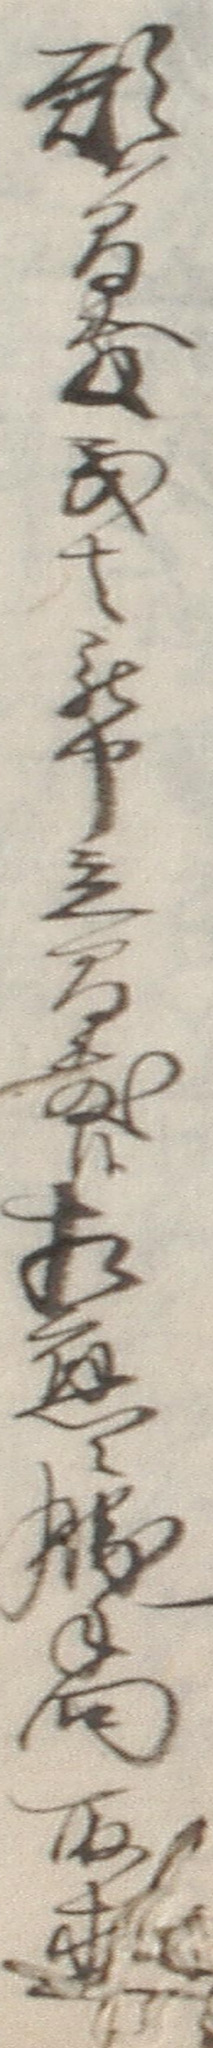願候間敷義は被申立間敷候相応ニ勝手向取直
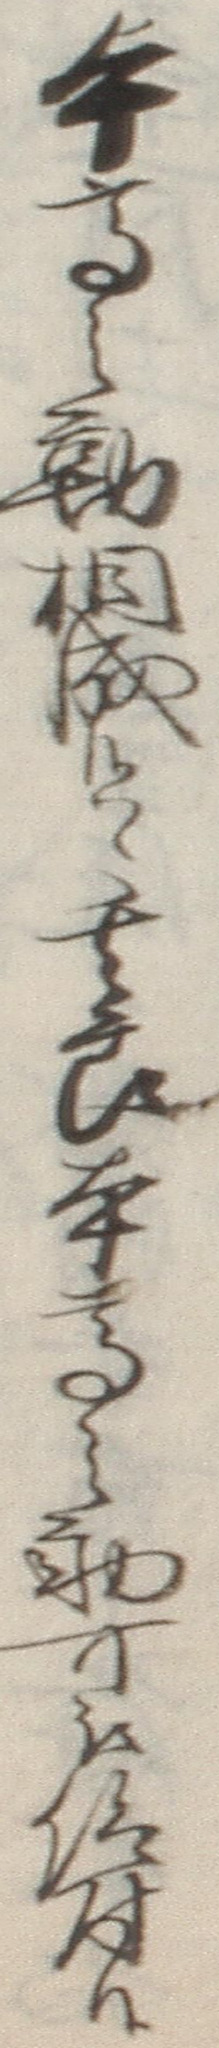本高之勤相成候ハヽ其節本高之勤可被仰付候
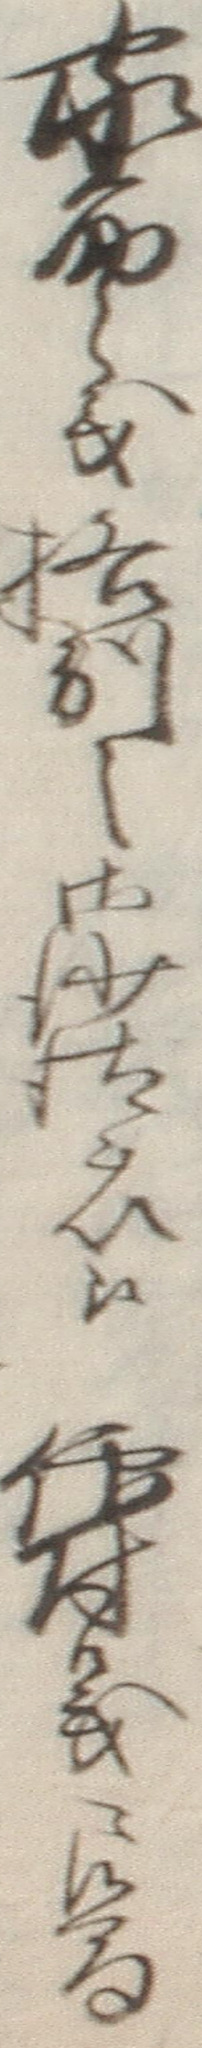家筋の義格別之御沙汰ヲ以被仰付候義ニ候間
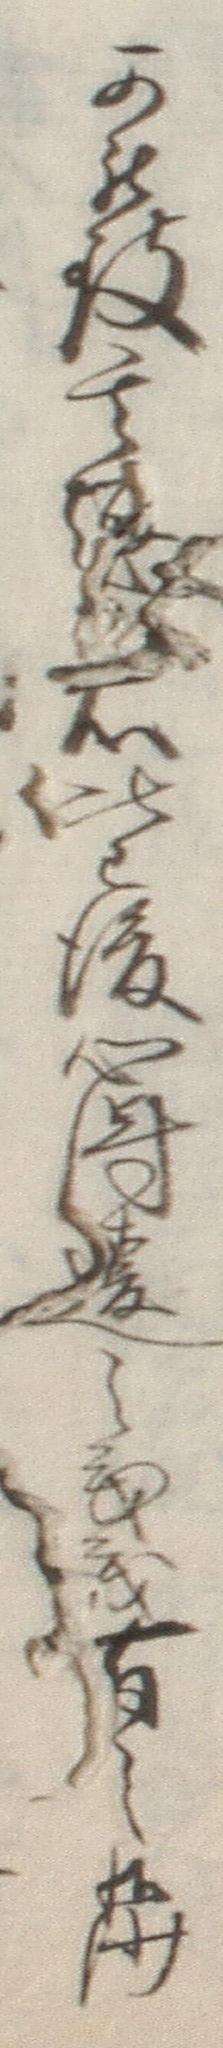可被致其此已後心得違之義も有之御沙
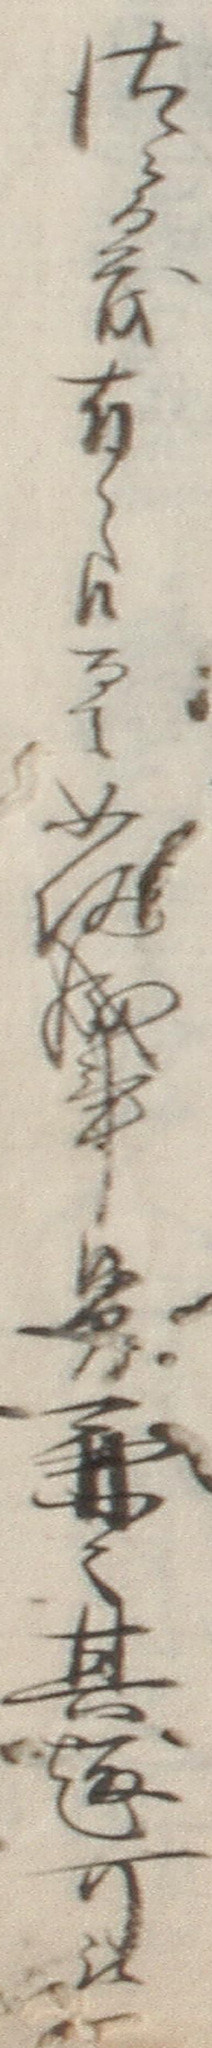汰ニ而も有之候而は如何成事候間兼々其趣可被

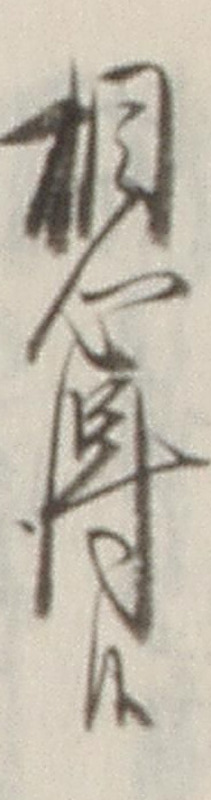相心得候
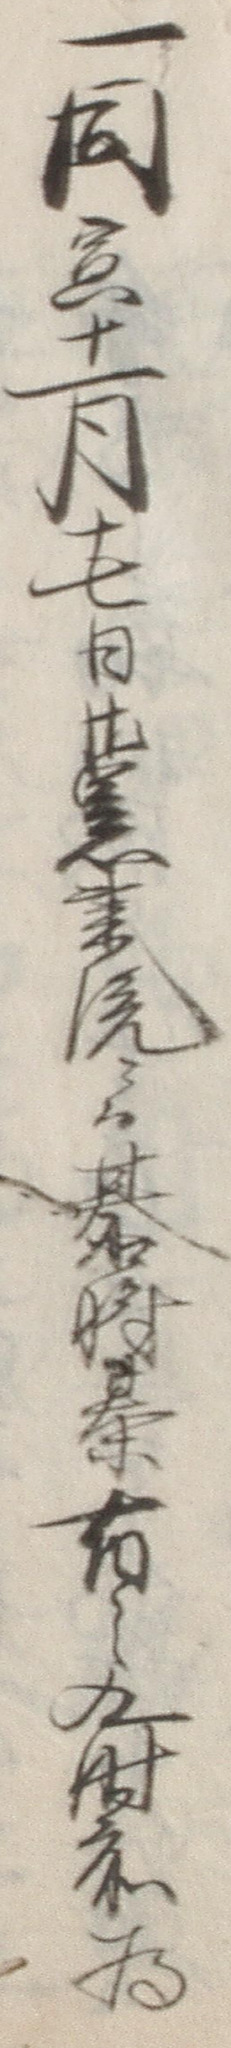一同寅十一月十七日御黒書院ニ而碁将棋有之九時前為
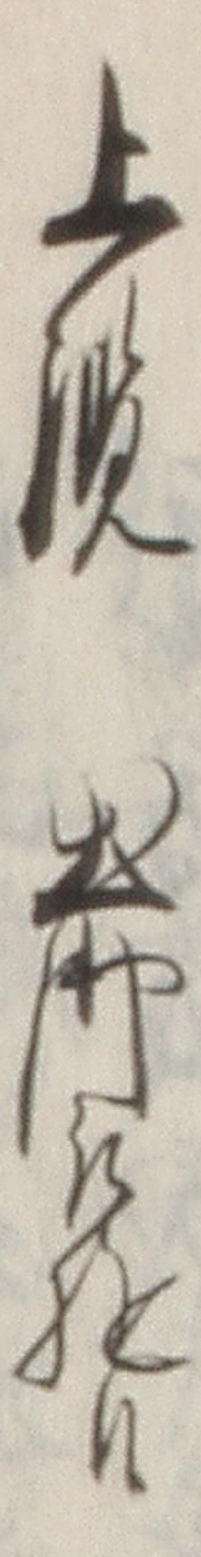上覧出御被遊候
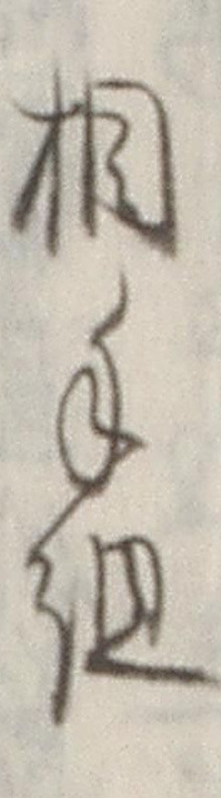相手組
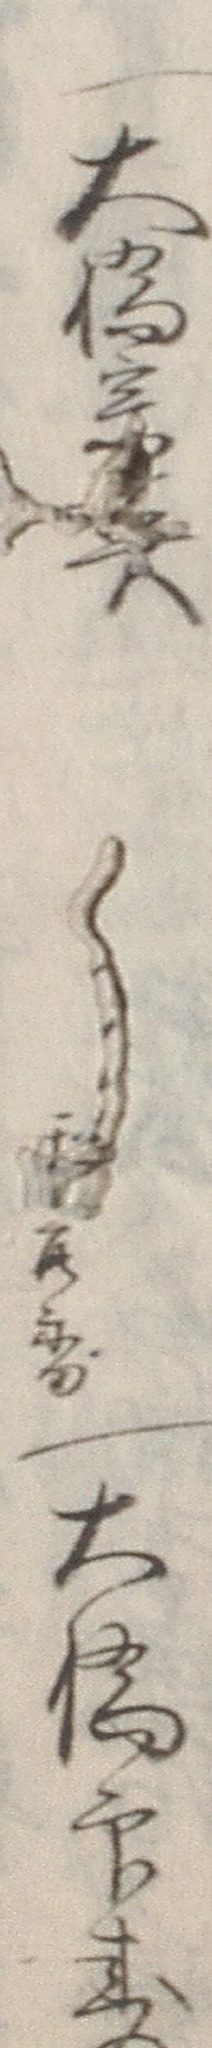勝大橋宗與大橋印壽
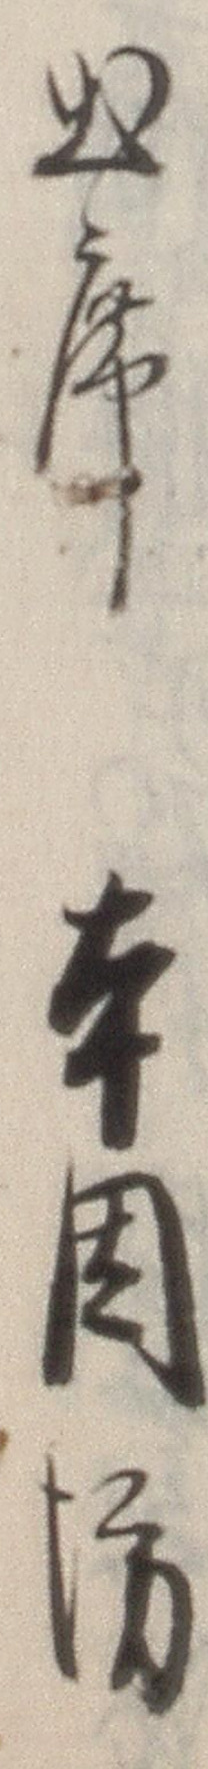出席本因坊
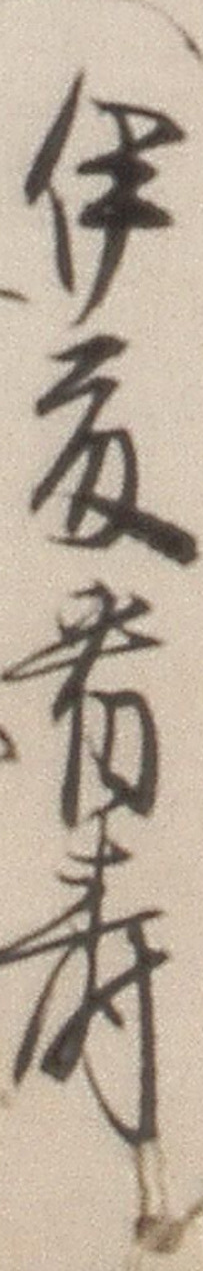伊藤看寿
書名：[諸国災害記録]
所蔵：東京大学地震研究所図書室 Earthquake Research Institute Library, The University of Tokyo, JAPAN
